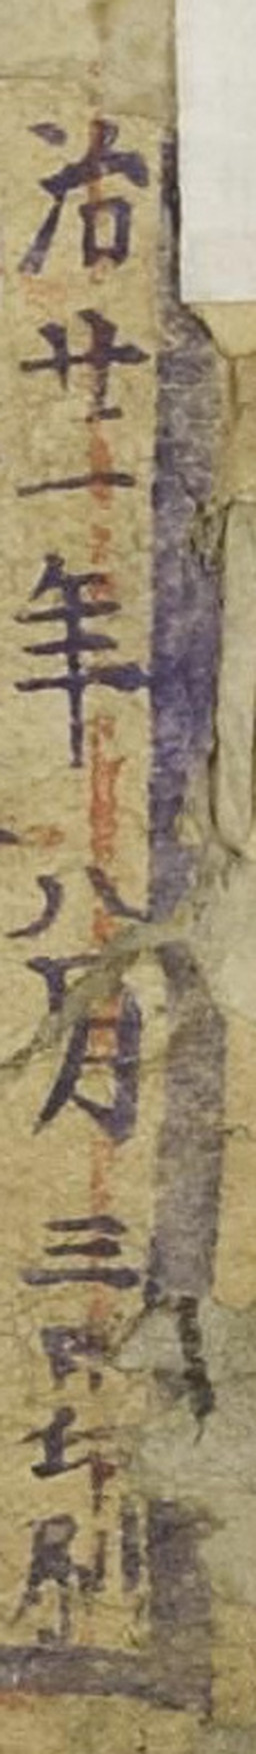明治廿一年八月三日印刷
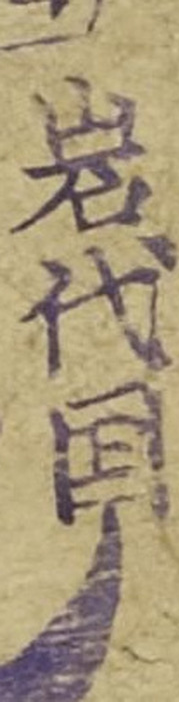岩代国
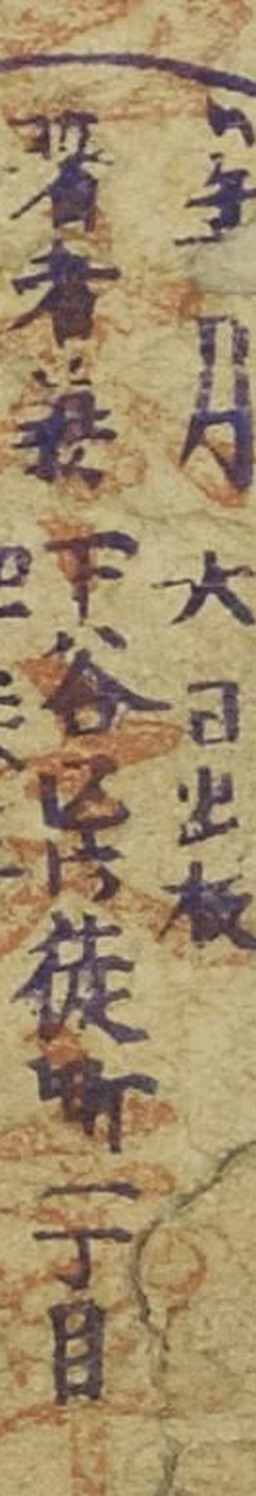著者兼下谷区御徒町一丁目
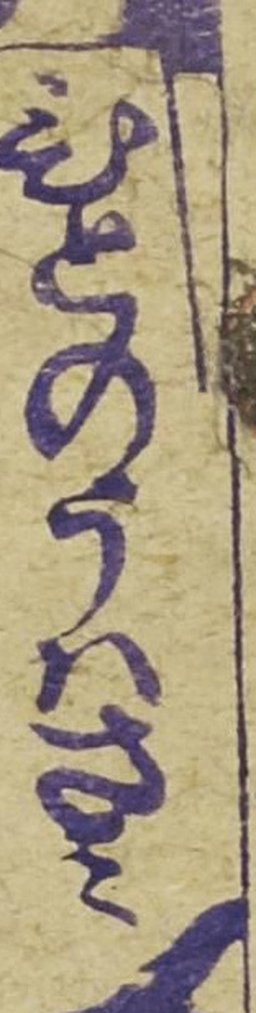〽ひとのうはさに
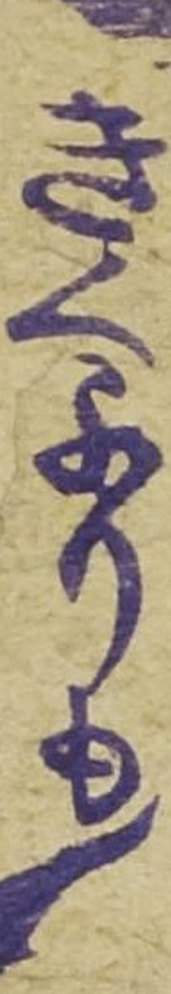きくよりも
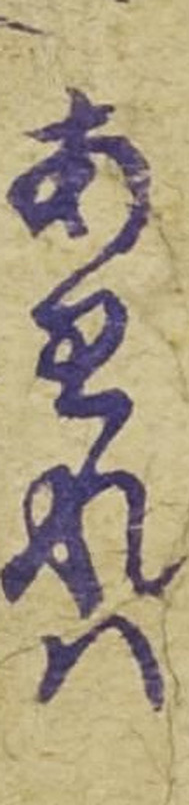あわれは
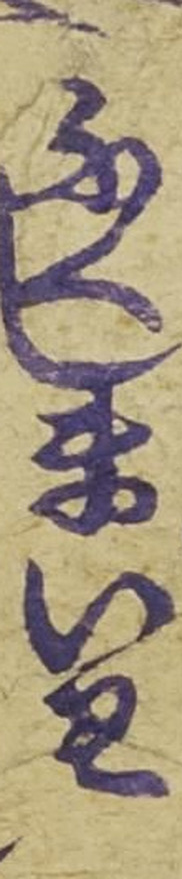ふくしまいわ
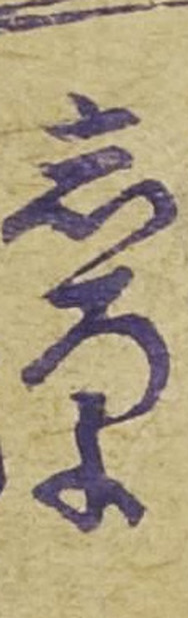しろよ
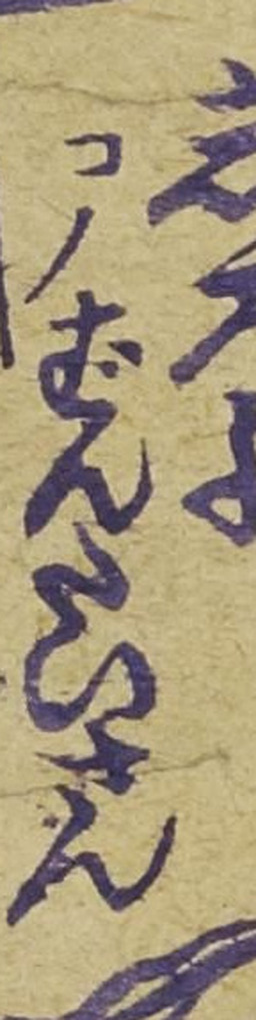コノばんたいさん
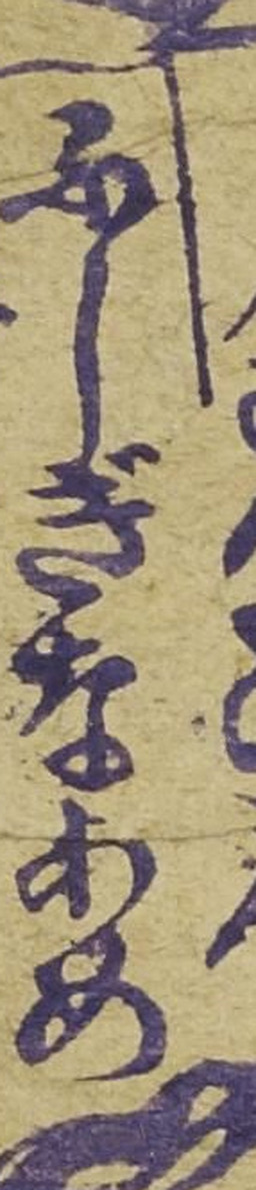〽ふしぎなあめ
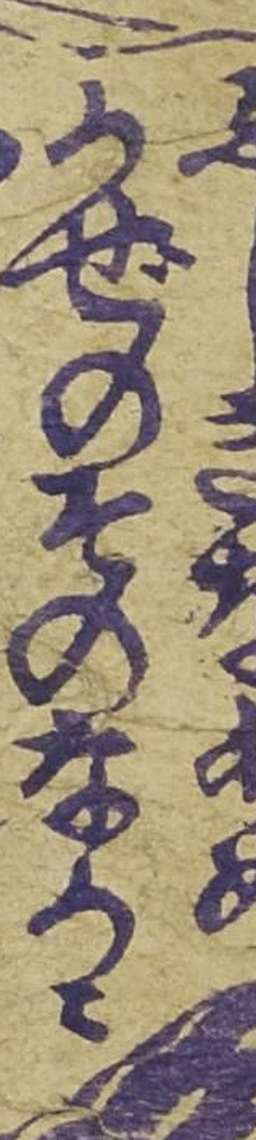かぜのそのなかに
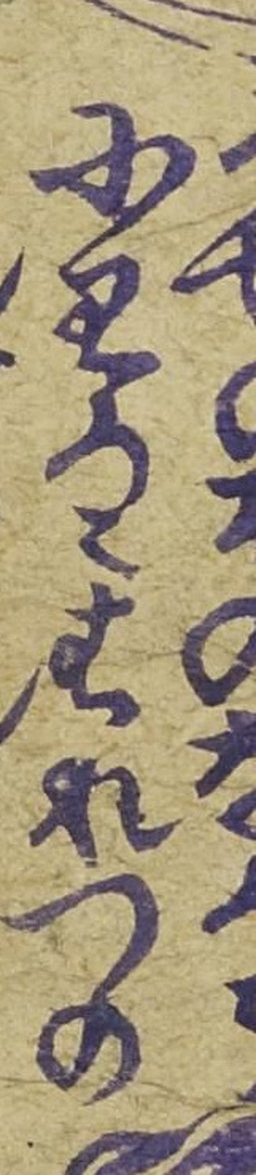にわかにはれつの
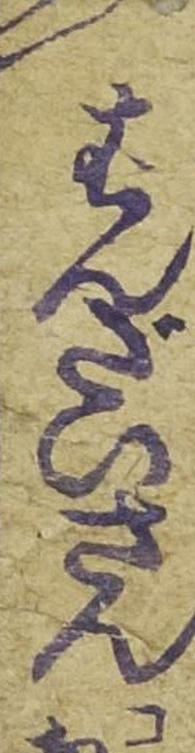ばんだいさん

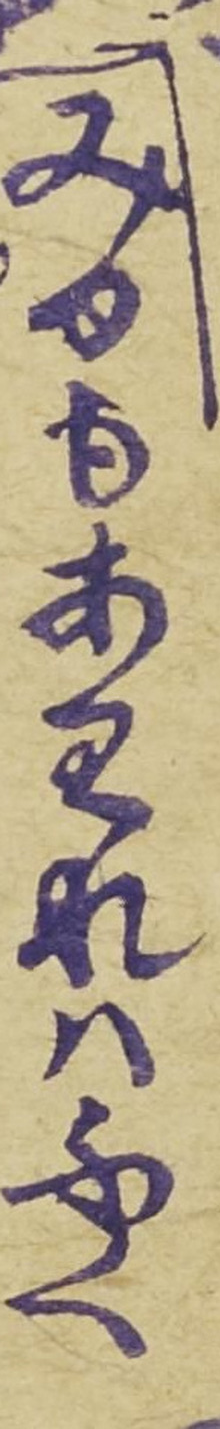〽みるもあわれはふく
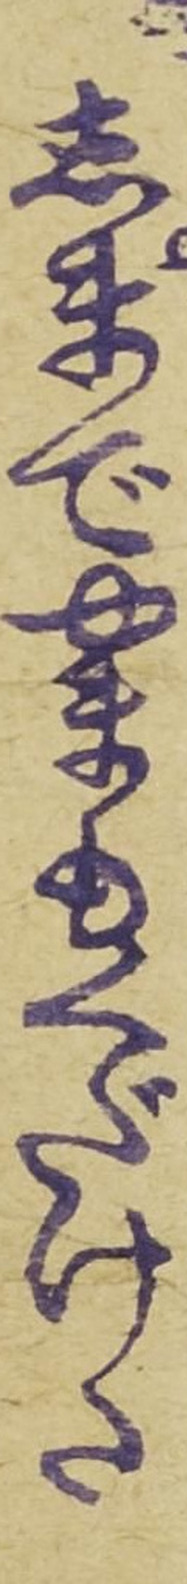しまでやまもくだけた
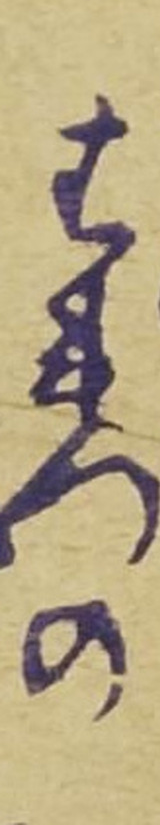はれつの
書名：福嶋縣岩代国　ばんだいさん一ツトセぶし
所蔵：東京大学地震研究所図書室 Earthquake Research Institute Library, The University of Tokyo, JAPAN
